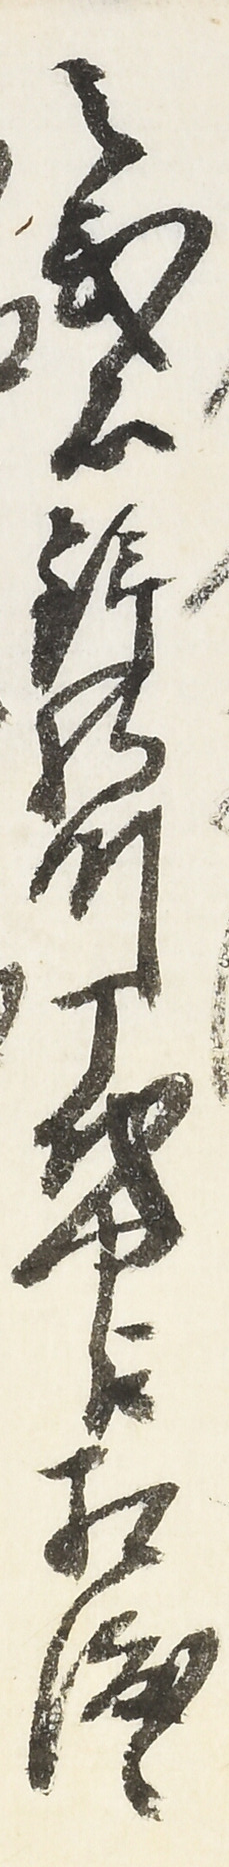之義者鉾持町丁代中迄相渡候
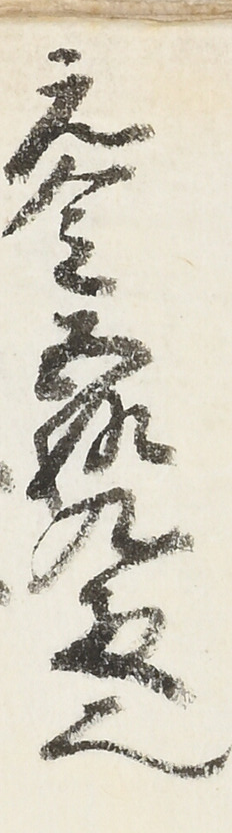元金五拾九両也
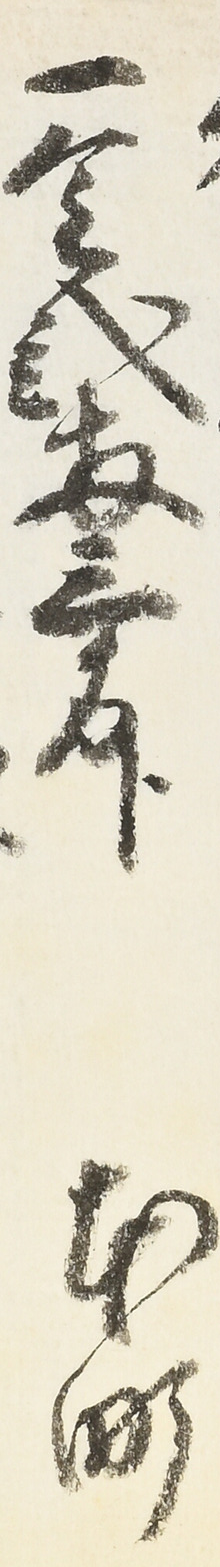一金二両三分ト本町
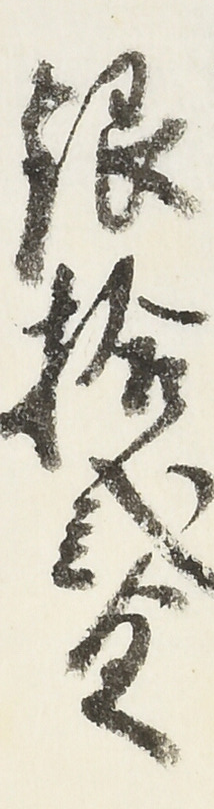銀拾弐匁
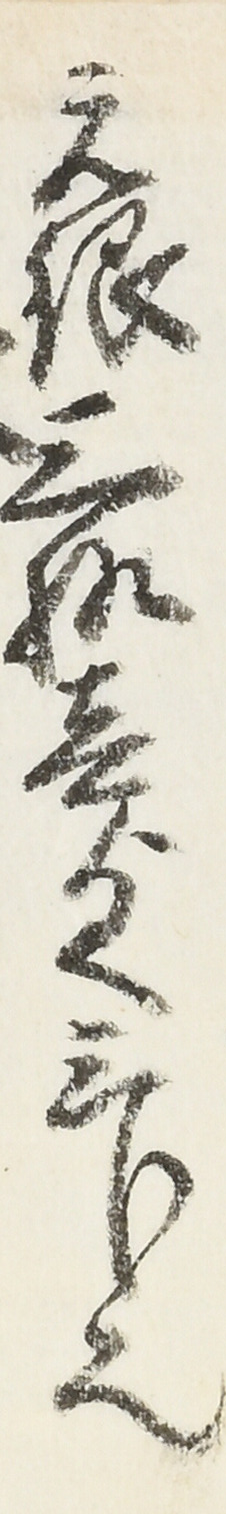元銀三拾壱匁三分也
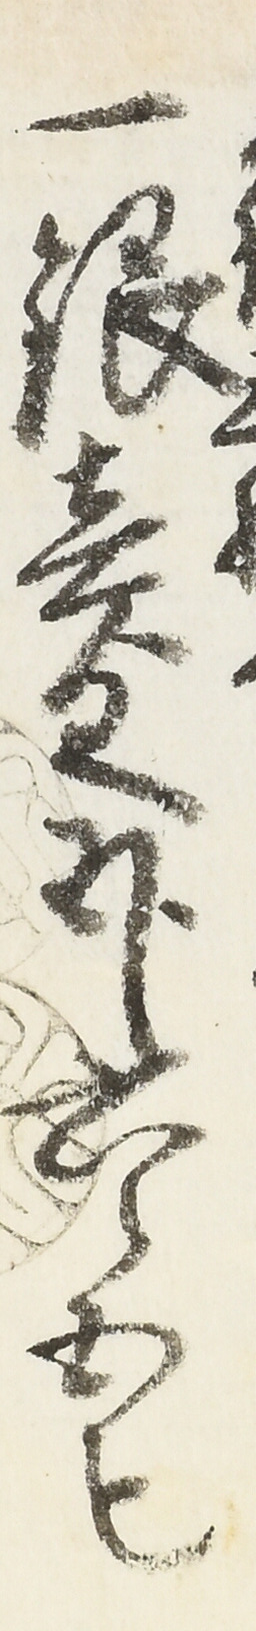一銀壱匁五分六厘五毛
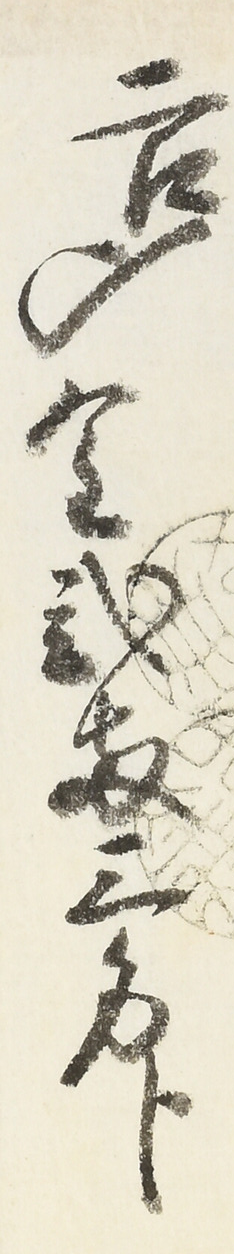二口〆金弐両三分ト

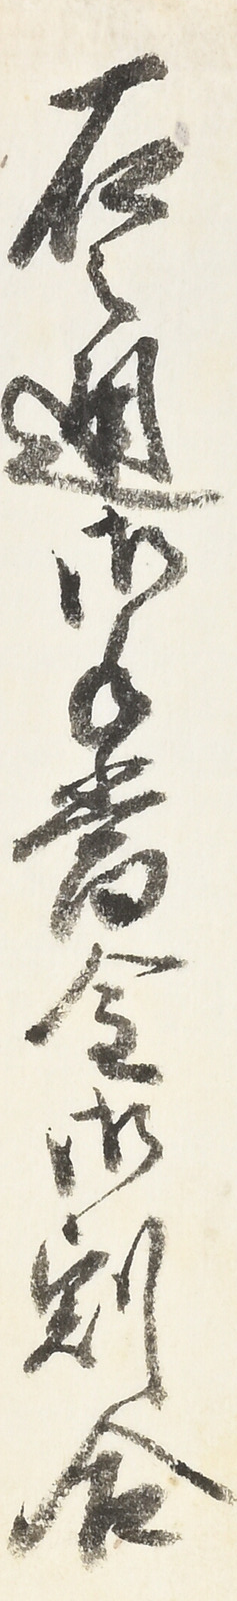右之通御手当金御割合
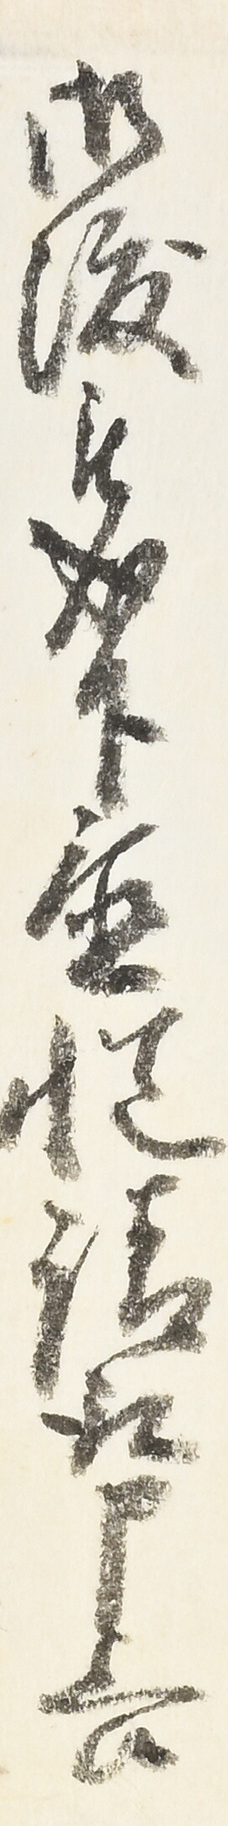御渡被成下置慥請取申上候
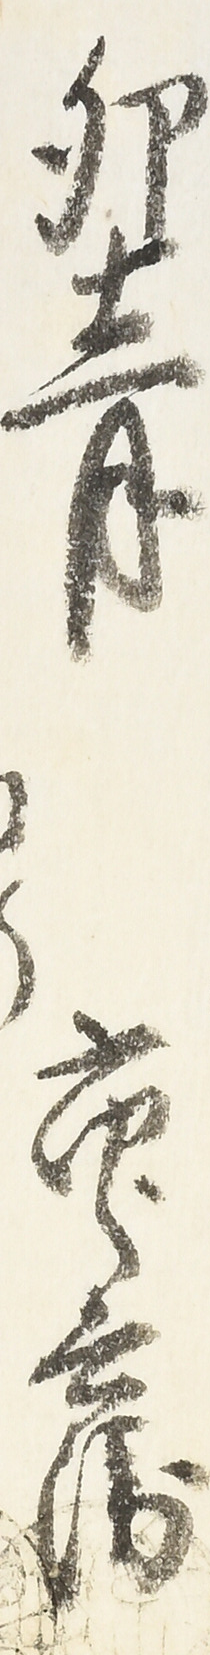卯十二月市郎兵衛
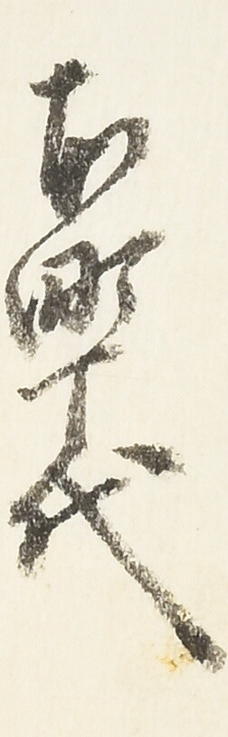本町丁代
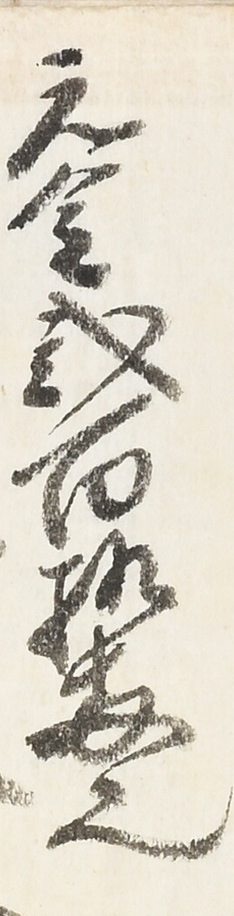元金弐百拾両也
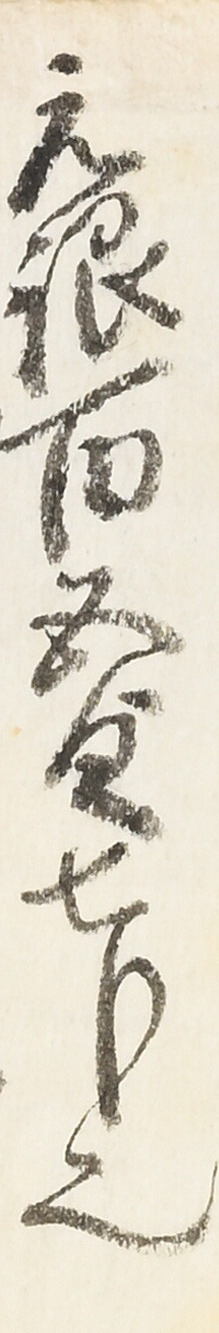元銀百五匁七分也
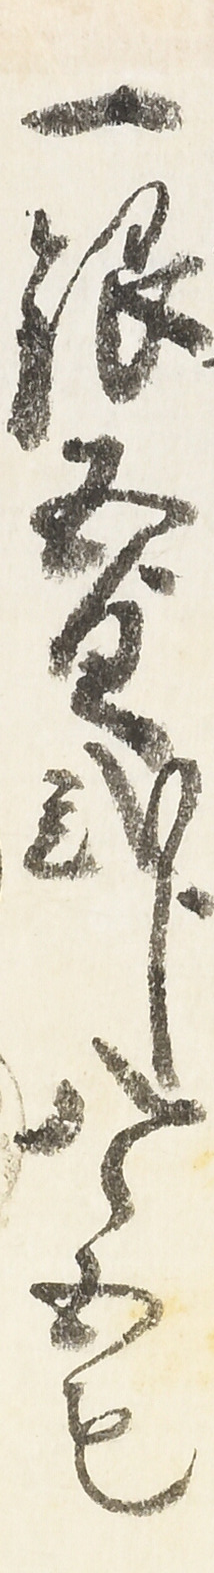一銀五匁弐分八厘五毛
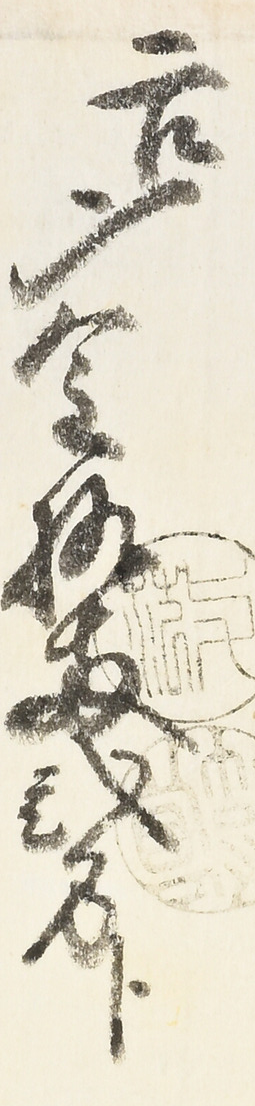二口〆金拾両弐分ト
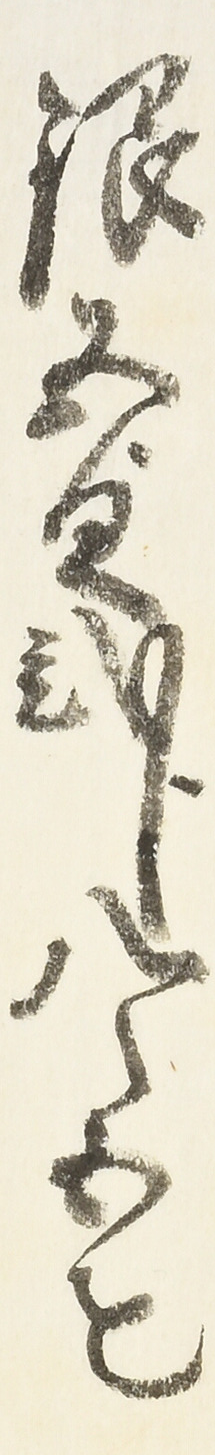銀五匁弐分八厘五毛
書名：御才覚金御利足割渡扣帳
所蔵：伊那市立高遠町図書館・合同会社AMANE
